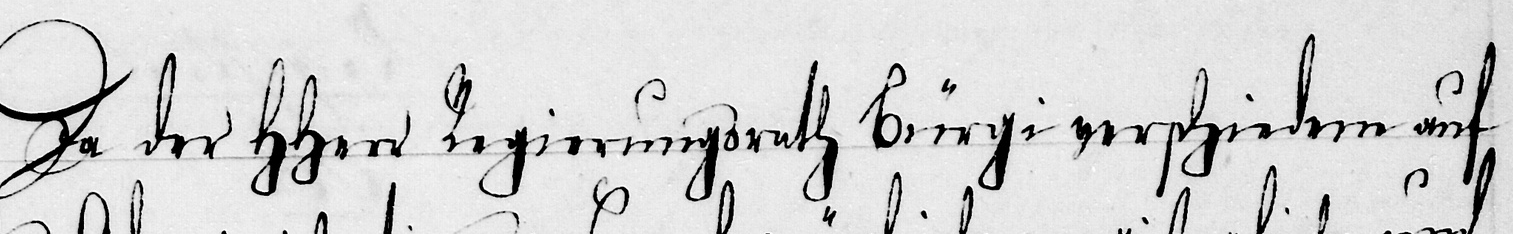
Da der HHerr Regierungsrath Bürgi verschiedene auf
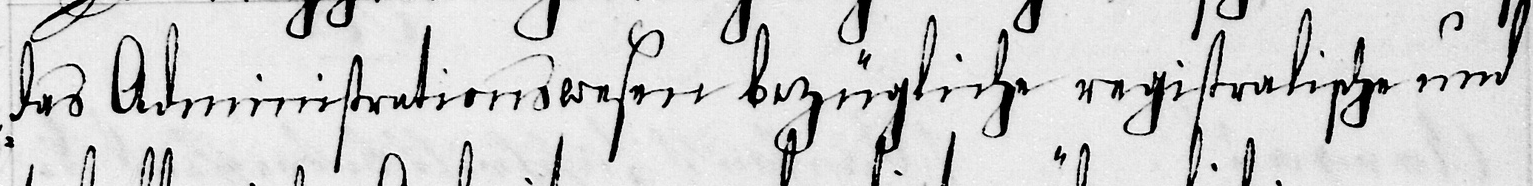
das Administrationswesen bezügliche registralische und
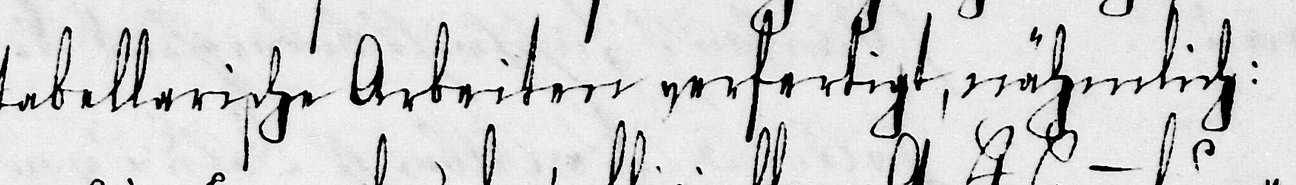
tabellarische Arbeiten verfertigt, nähmlich:
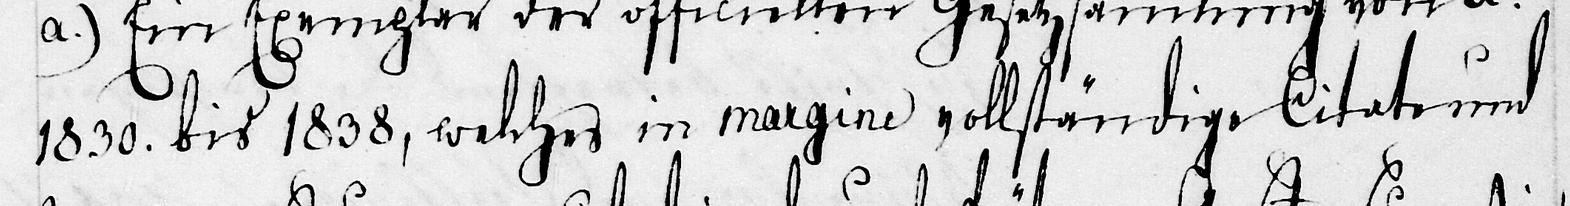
1830. bis 1838, welches in margine vollständige Citate und
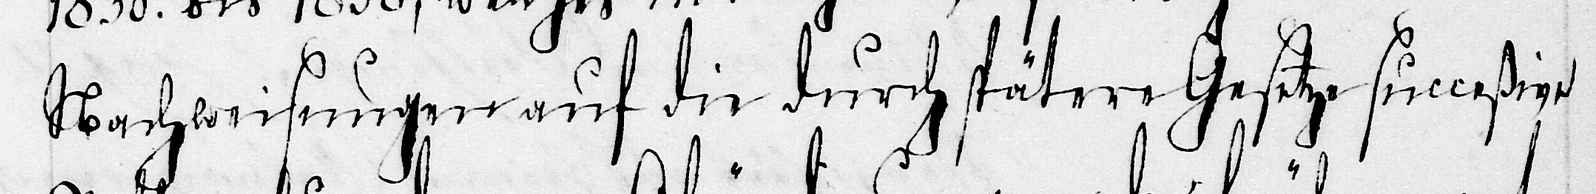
Nachweisungen auf die durch spätere Gesetze succeßive
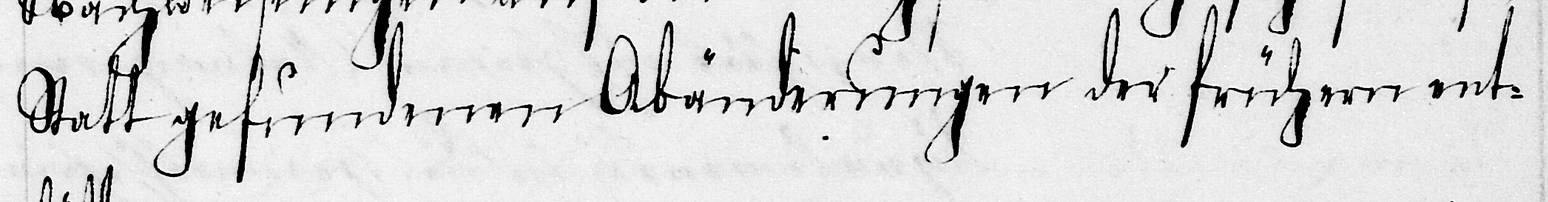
Statt gefundenen Abänderungen der frühern ent¬
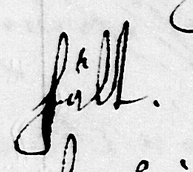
hält.
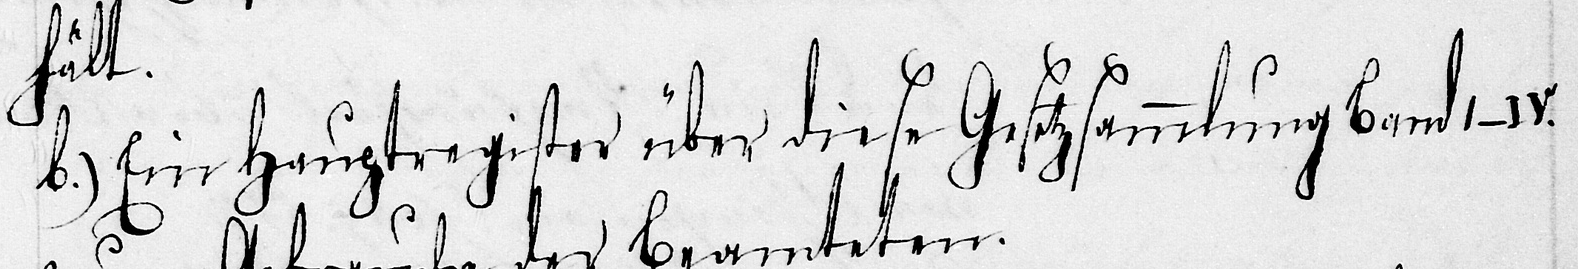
b.) Ein Hauptregister über diese Gesetzsammlung Band I–IV.
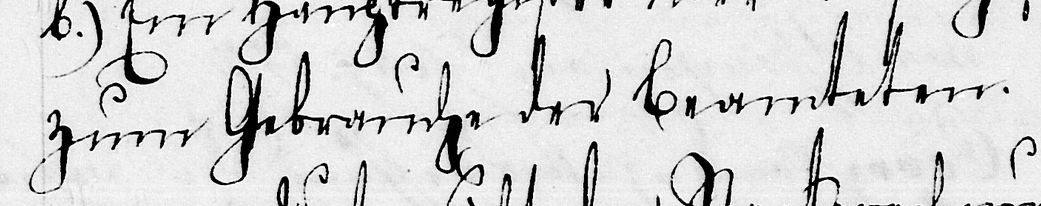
zum Gebrauche der Beamteten.
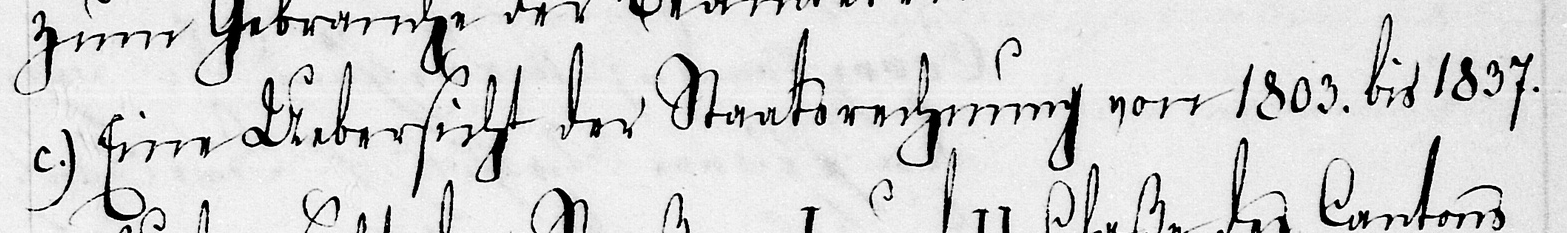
c.) Eine Uebersicht der Staatsrechnung von 1803. bis 1837.
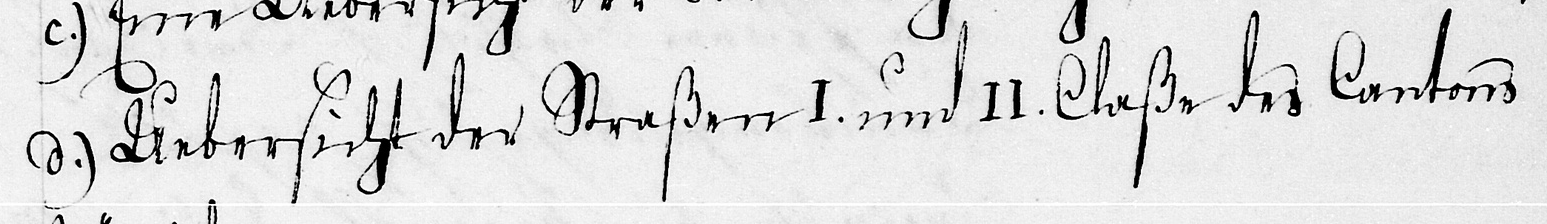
d.) Uebersicht der Straßen I. und II. Claße des Cantons
